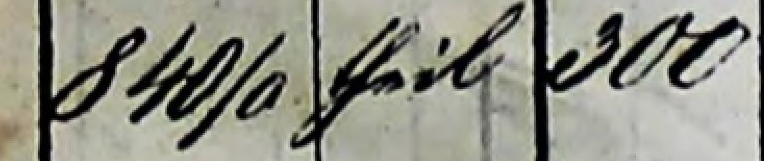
840/a theil 300
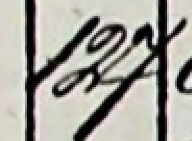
127
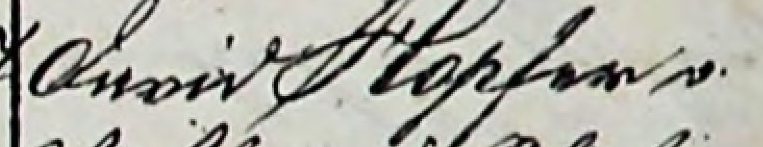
David Hopfer v.
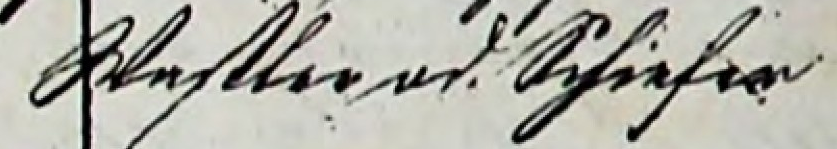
Wastler od. Schiefer
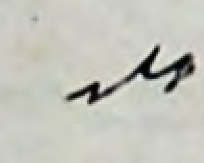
do
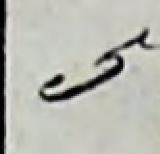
5
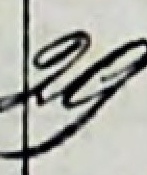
29
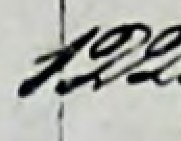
122
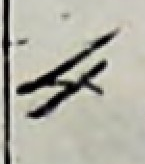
4
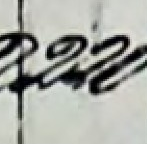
220
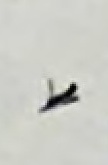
„
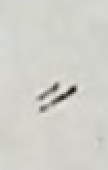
„
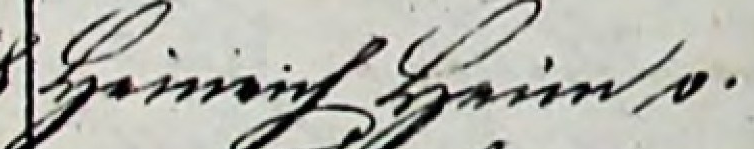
Heinrich Heim v.
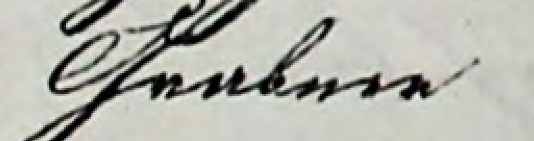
Grabner
